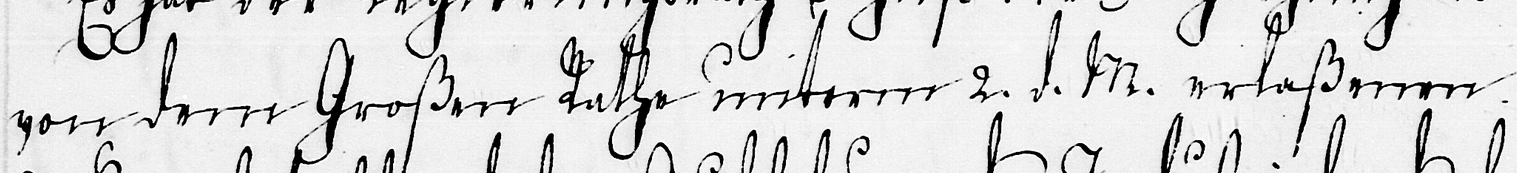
von dem Großen Rathe unterm 2. d. M. erlaßenen
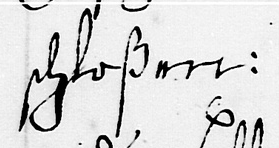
schloßen:
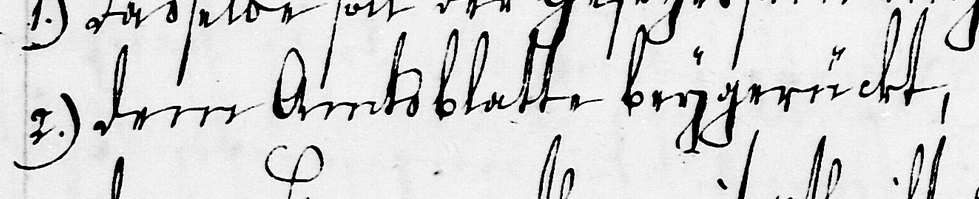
2.) dem Amtsblatte beygerückt,
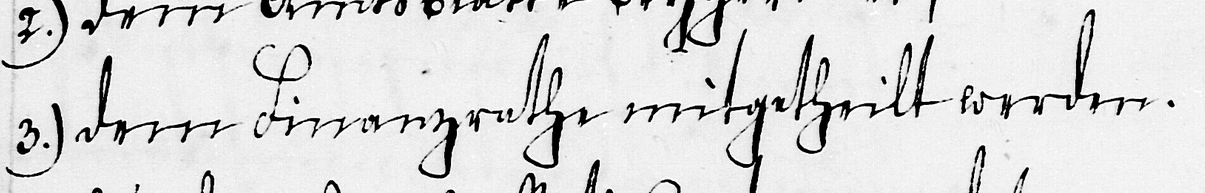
3.) dem Finanzrathe mitgetheilt werden.
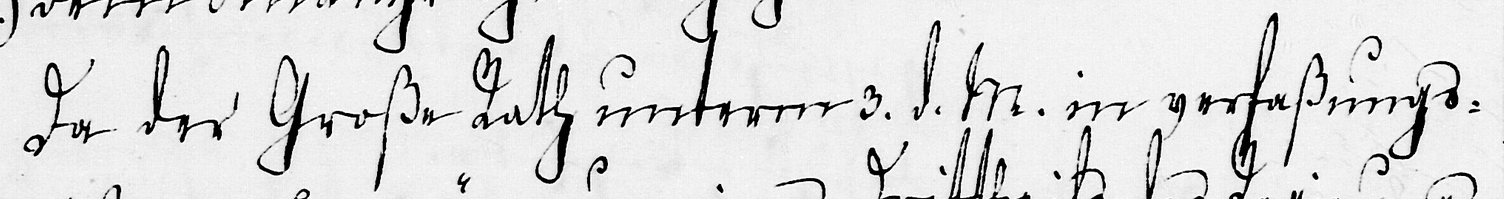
Da der Große Rath unterm 3. d. M. in verfaßungs¬
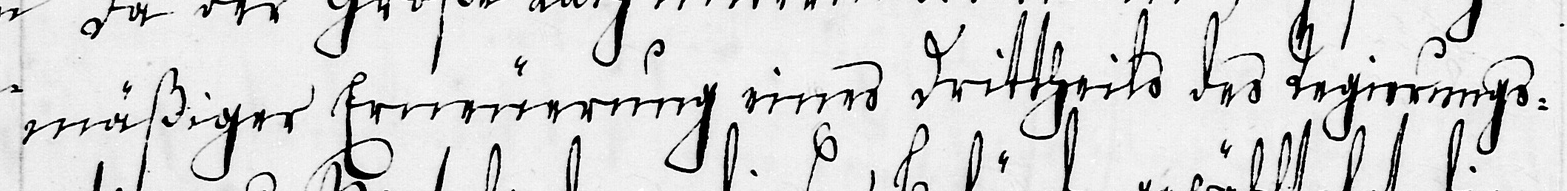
mäßiger Erneuerung eines Drittheils des Regierungs¬
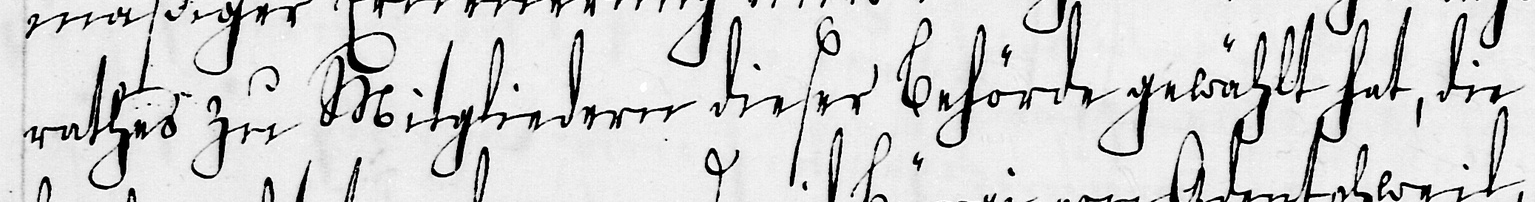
rathes zu Mitgliedern dieser Behörde gewählt hat, die
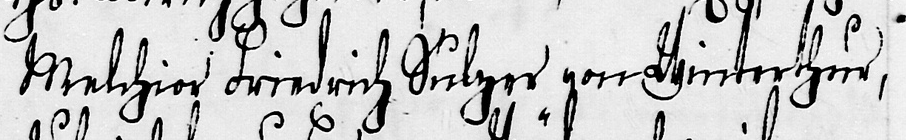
Melchior Friedrich Sulzer von Winterthur,
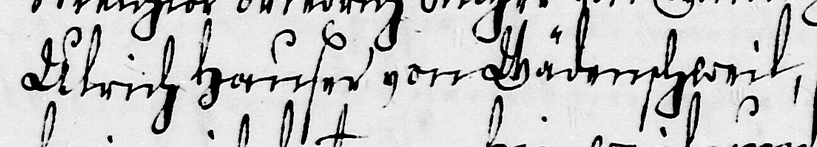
Ulrich Hauser von Wädenschweil,
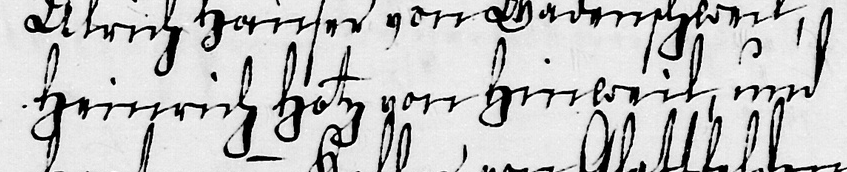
Heinrich Hotz von Hinweil, und
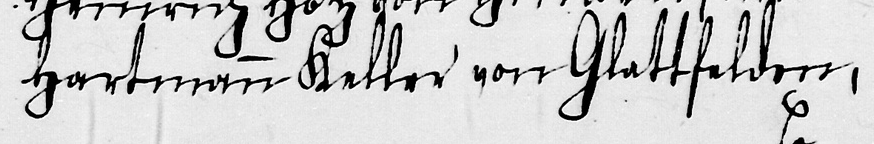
Hartmann Keller von Glattfelden,
